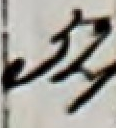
52
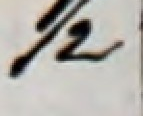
1/2
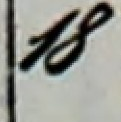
18
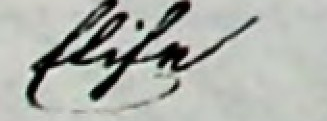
elise
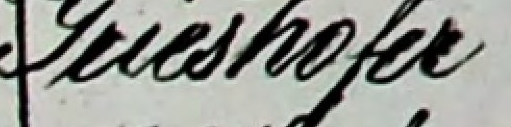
Grieshofer
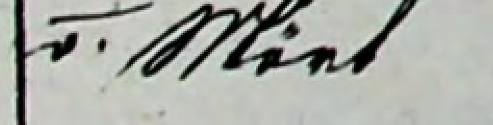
v. Mört
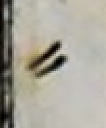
„
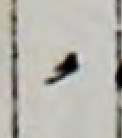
„
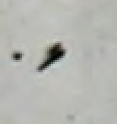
„
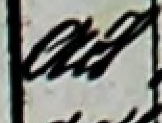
Alt
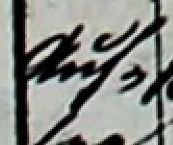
Aus„
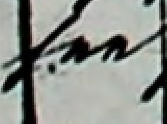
see
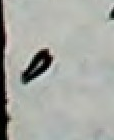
„
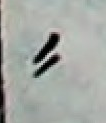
„
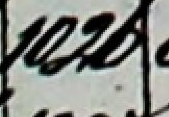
1026
